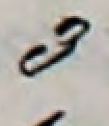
3
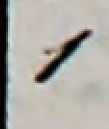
1
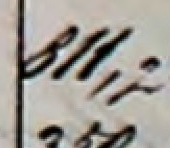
811,2
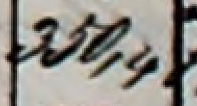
350,4
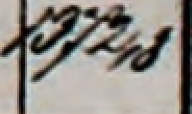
1372,8
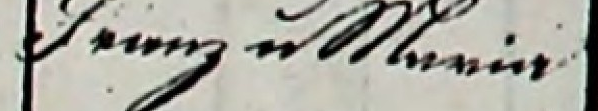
Franz u Maria
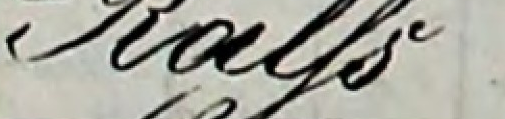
Kalss
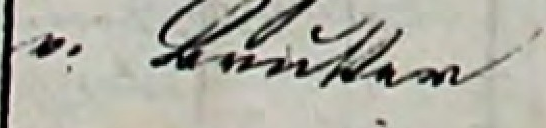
v. Brutter
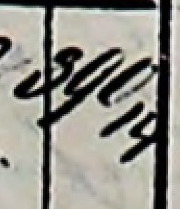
390,4
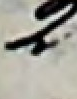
2
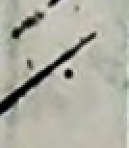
./.
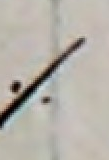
./.
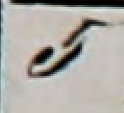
5
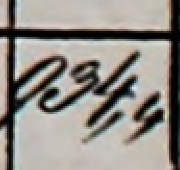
934,4
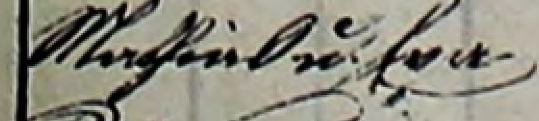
Mathias u. Eva
